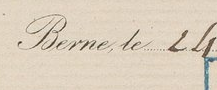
Berne, le
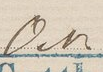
Oct.
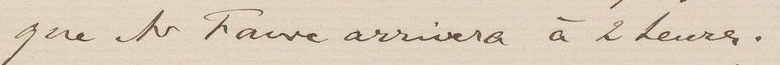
que MrFavre arrivera à 2 heures.
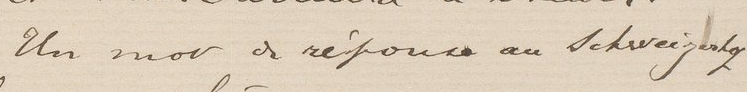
Un mot de réponse au Schweizerhof
